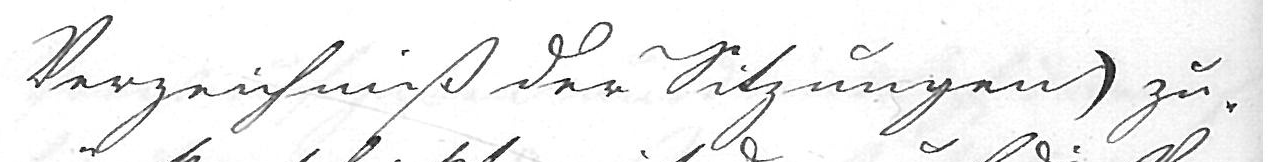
Verzeichniß der Sitzungen) zu-
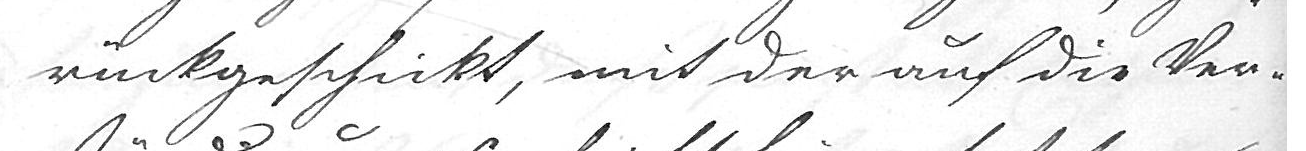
rückgeschickt, mit der auf die Ver-
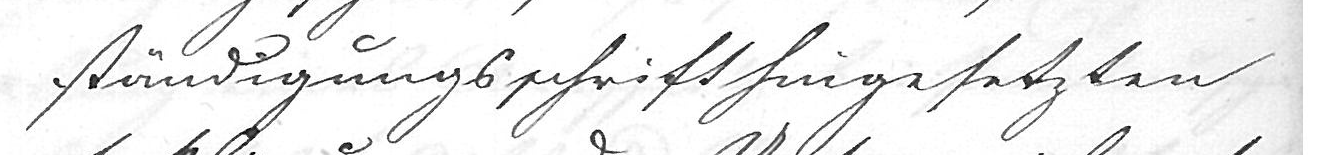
ständigungsschrift hingesetzten
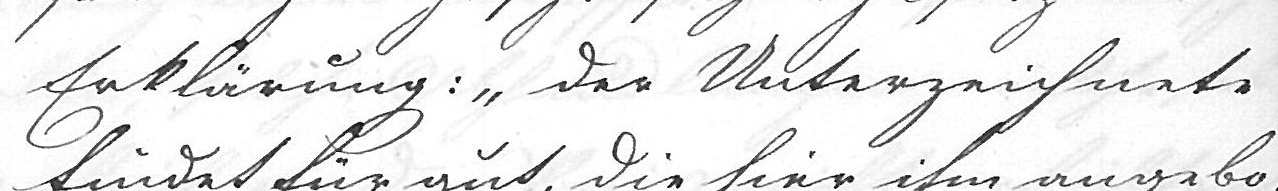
Erklärung: "Der Unterzeichnete
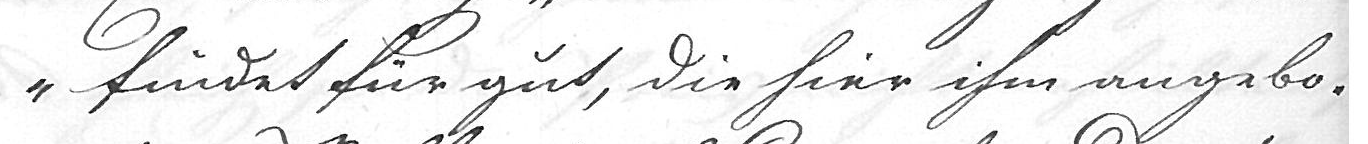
"findet für gut, die hier ihm angebo-
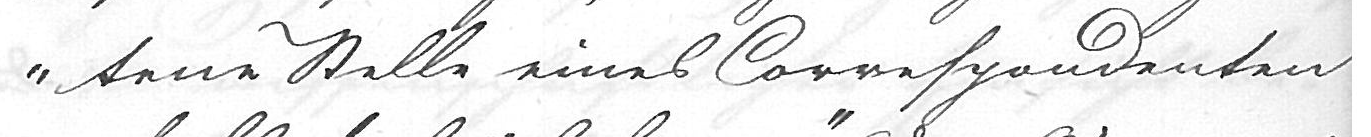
"tene Stelle eines Correspondenten
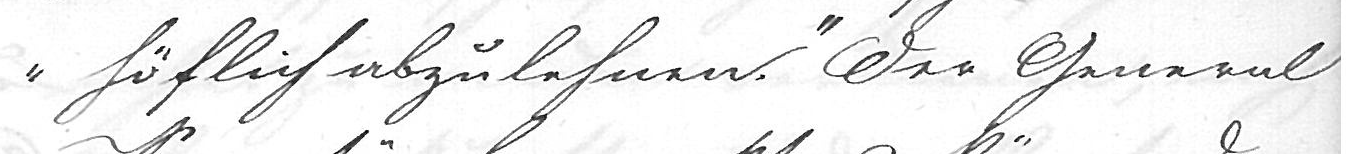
"höflich abzulehnen." Der General-
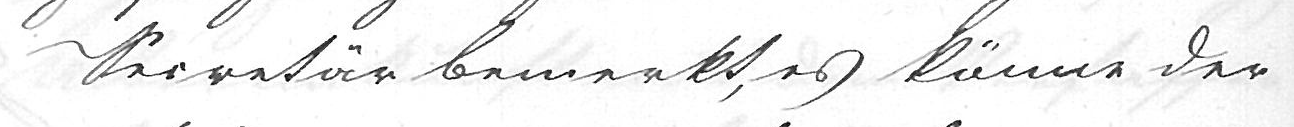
Secretär bemerkt, es könne der
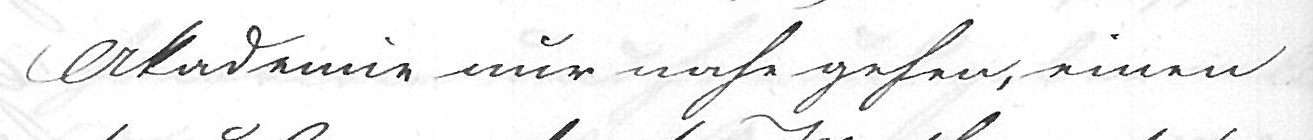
Akademie nur nahe gehen, einen
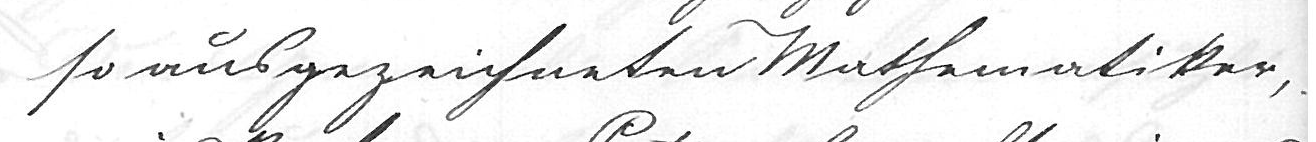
so ausgezeichneten Mathematiker,
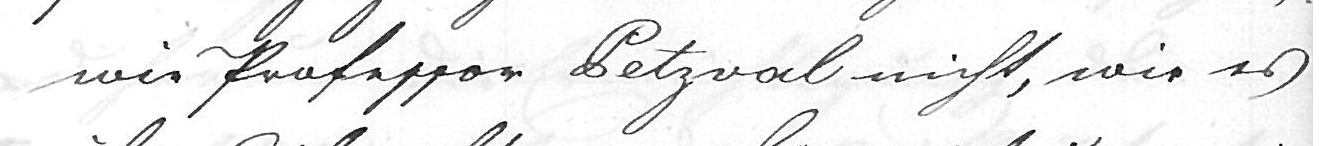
wie Professor Petzval nicht, wie es
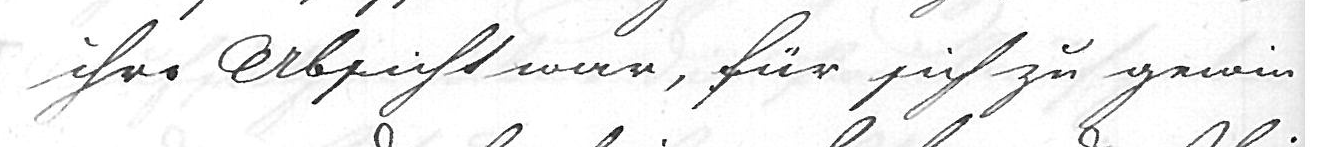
ihre Absicht war, für sich zu gewin-
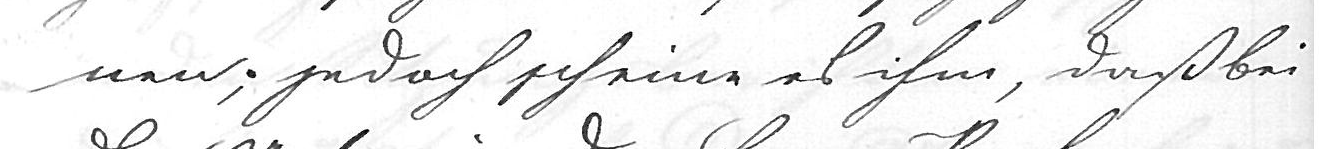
nen; jedoch scheine es ihm, daß bei
